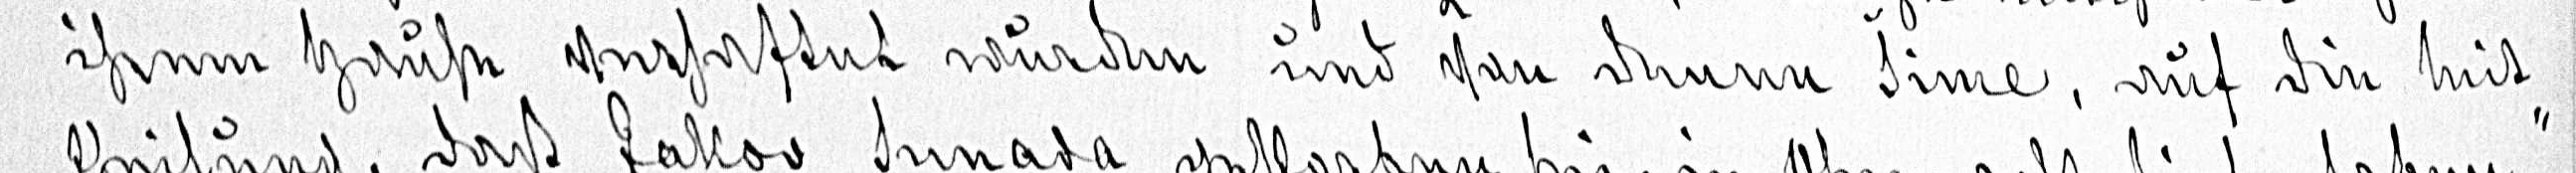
ihrem Hause verhaftet wurden und von denen Šime, auf die Mit¬
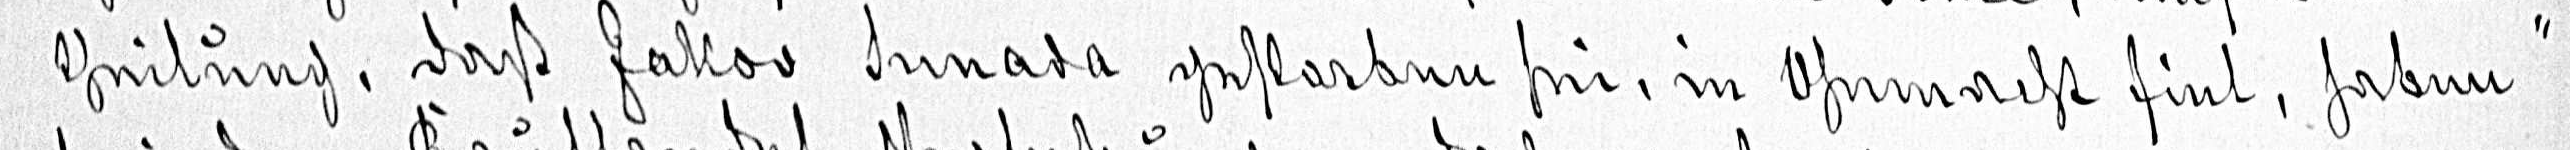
theilung, daß Jakov Iunara gestorben sei, in Ohnmacht fiel, haben
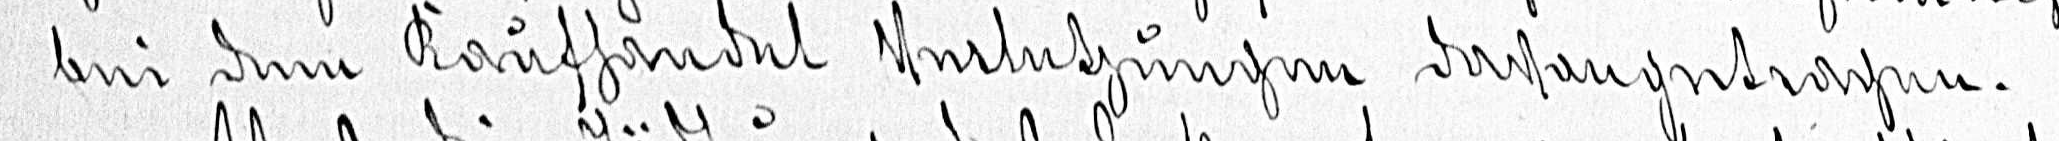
bei dem Raufhandel Verletzungen davongetragen.
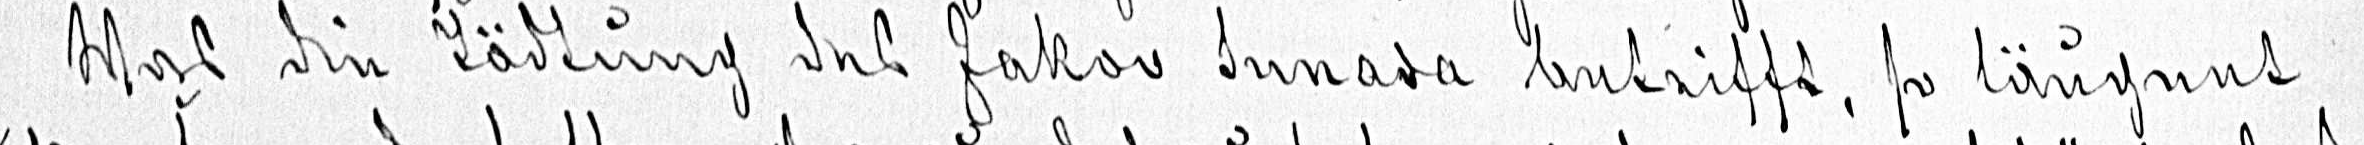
Was die Tödtung des Jakov Iunara betrifft, so läugnet
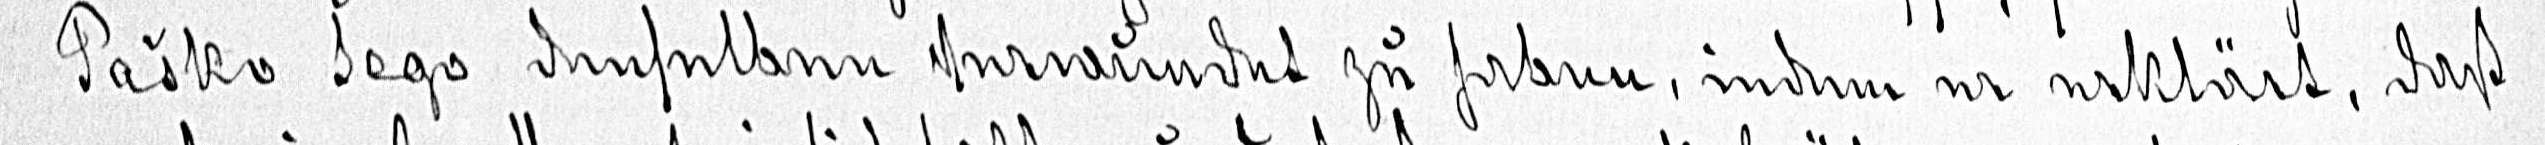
Paško Šego denselben verwundet zu haben, indem er erklärt, daß
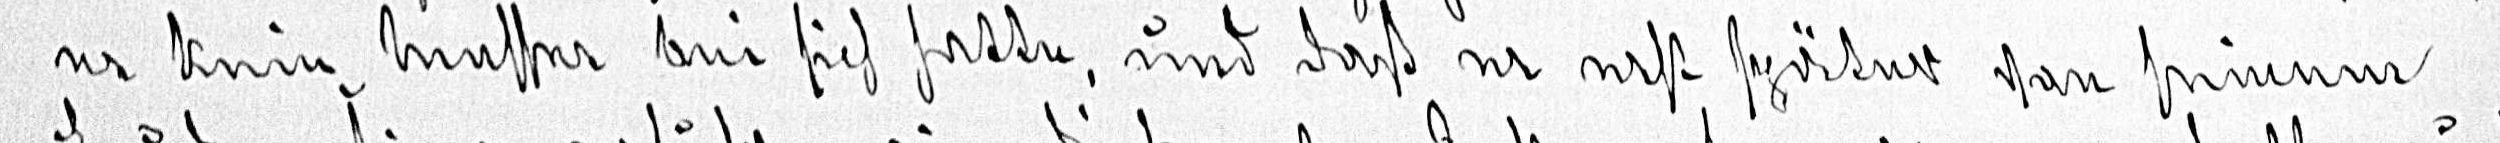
er kein Messer bei sich hatte, und daß er erst später von seinem
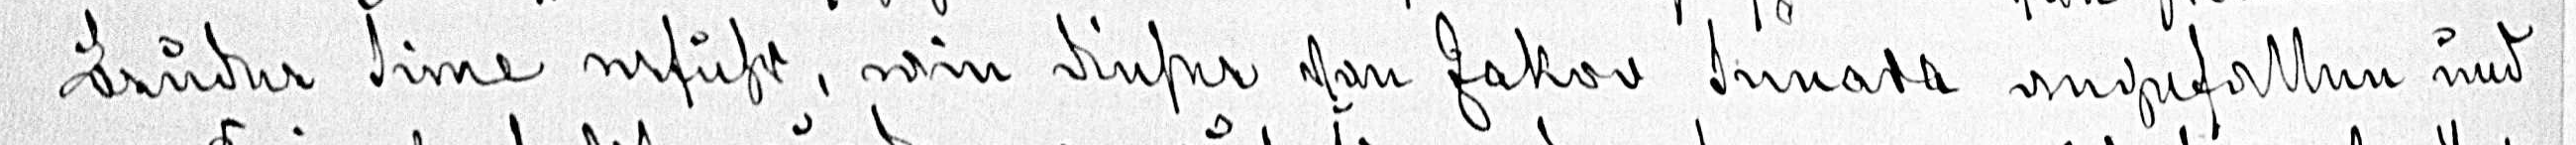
Bruder Šime erfuhr, wie dieser von Jakov Iunara angefallen und
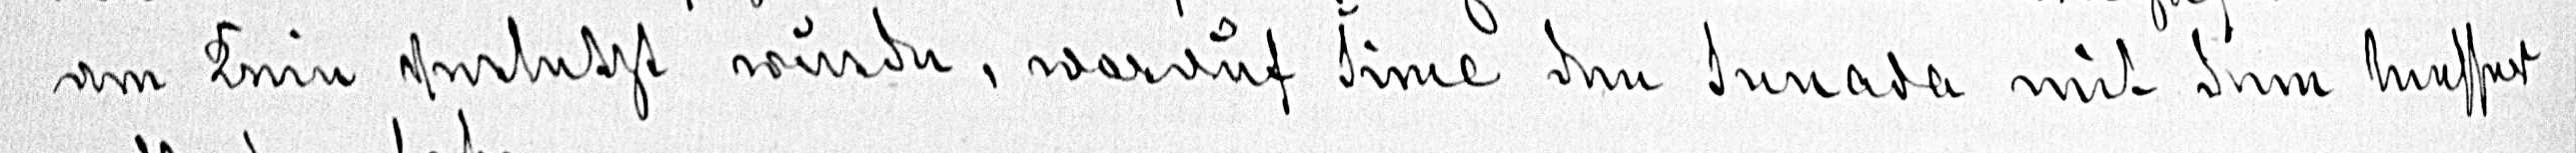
am Knie verletzt wurde, worauf Šime den Iunara mit dem Messer
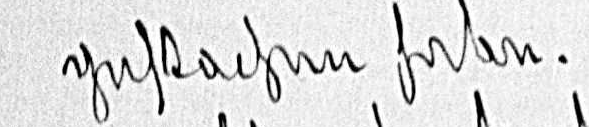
gestochen habe.
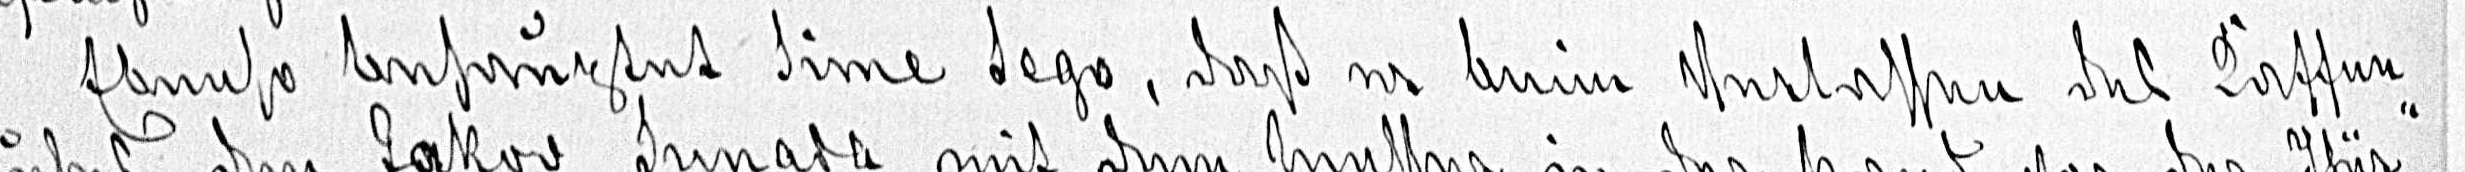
Ebenso behauptet Šime Šego, daß er beim Verlassen des Kaffee¬
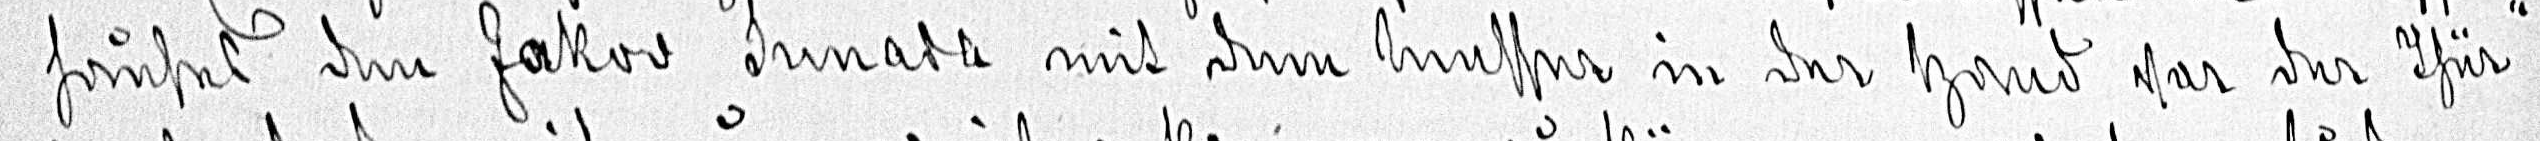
hauses den Jakov Iunara mit dem Messer in der Hand vor der Thür
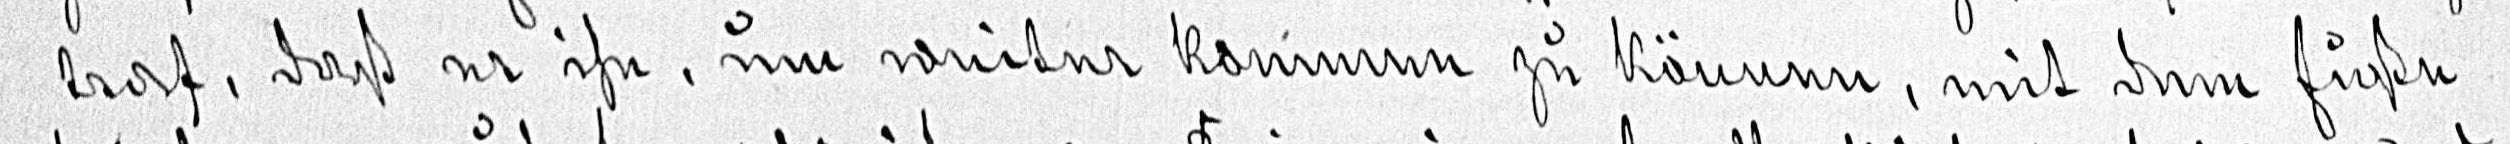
traf, daß er ihn, um weiter kommen zu können, mit dem Füße stieß,
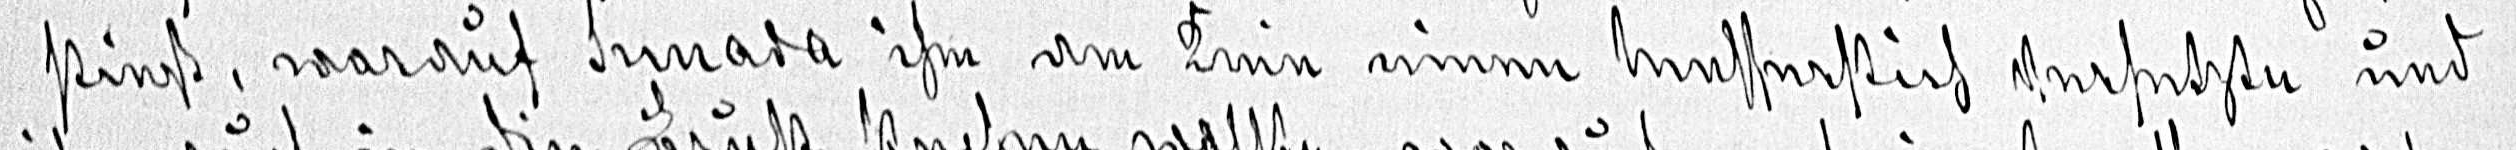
worauf Iunara ihm am Knie einen Messerstich versetzte und
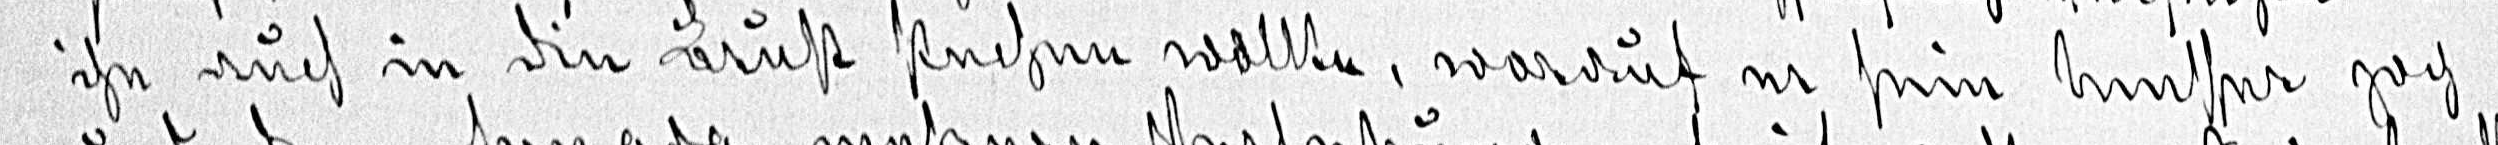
ihn auch in die Brust stechen wollte, worauf er sein Messer zog
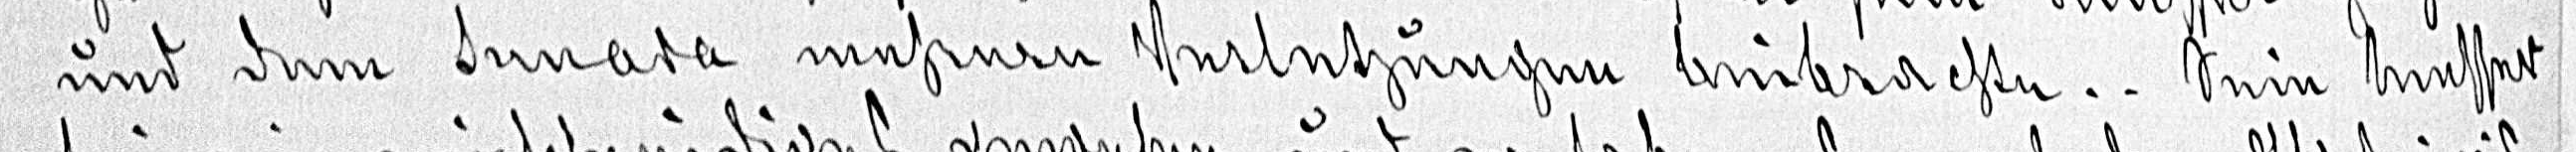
und dem Iunara mehrere Verletzungen beibrachte. Sein Messer
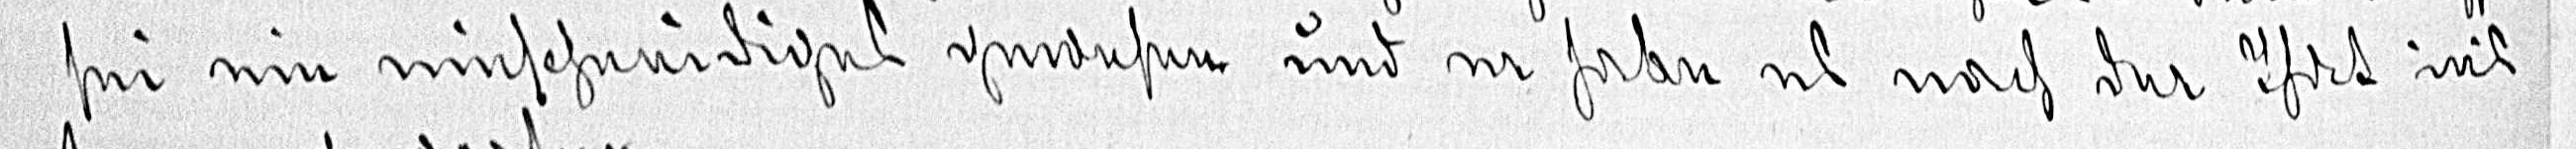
sei ein einschneidiges gewesen und er habe es nach der That ins
